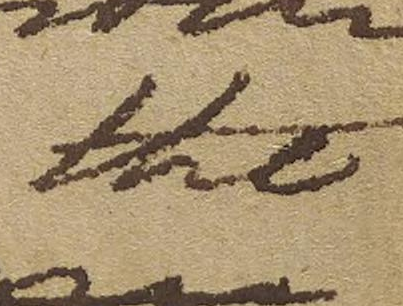the
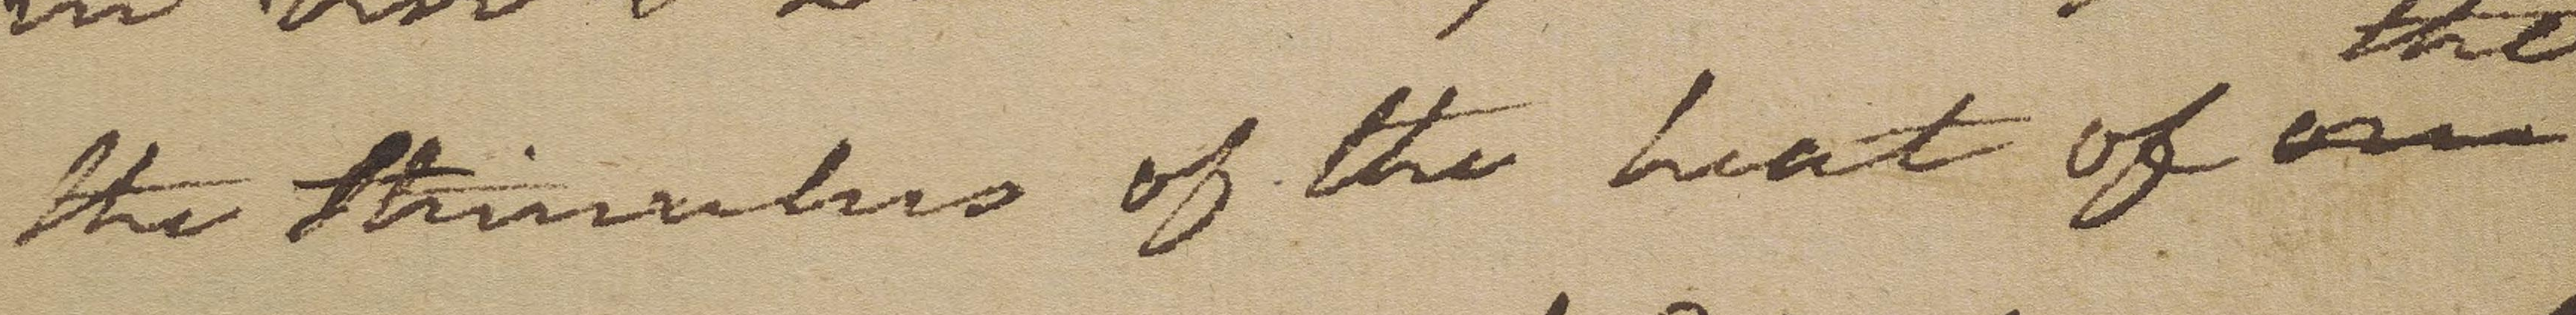the stimulus of the heat of [an]
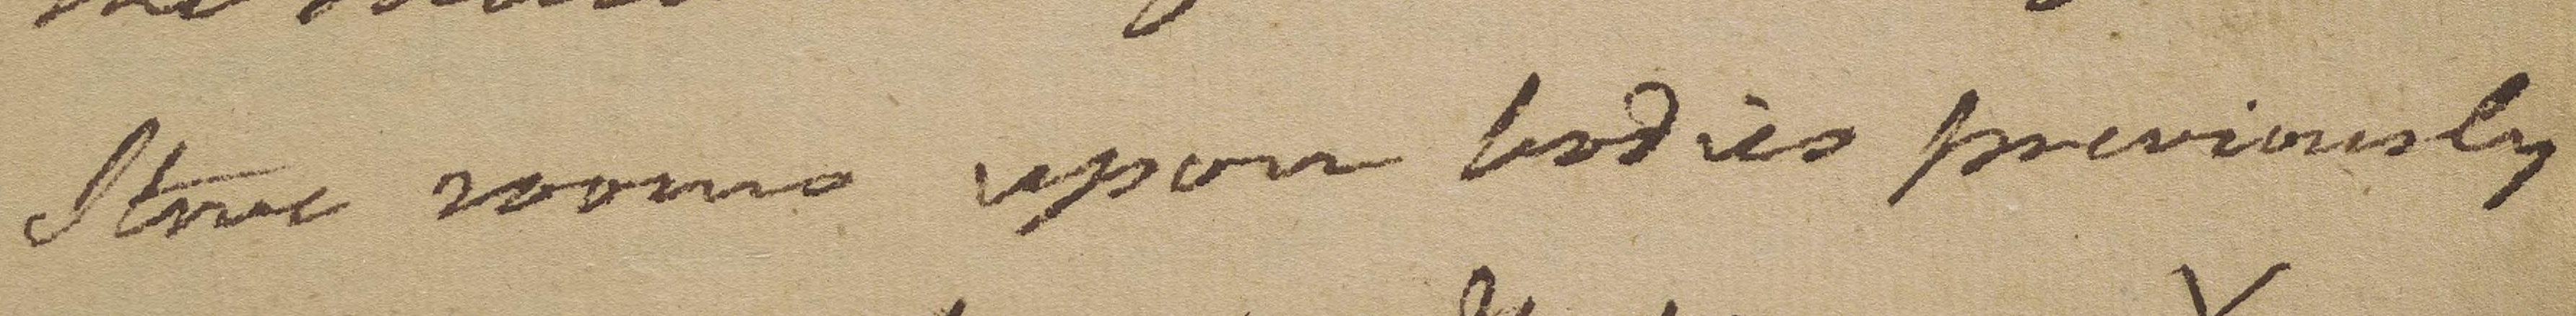store rooms upon bodies previously
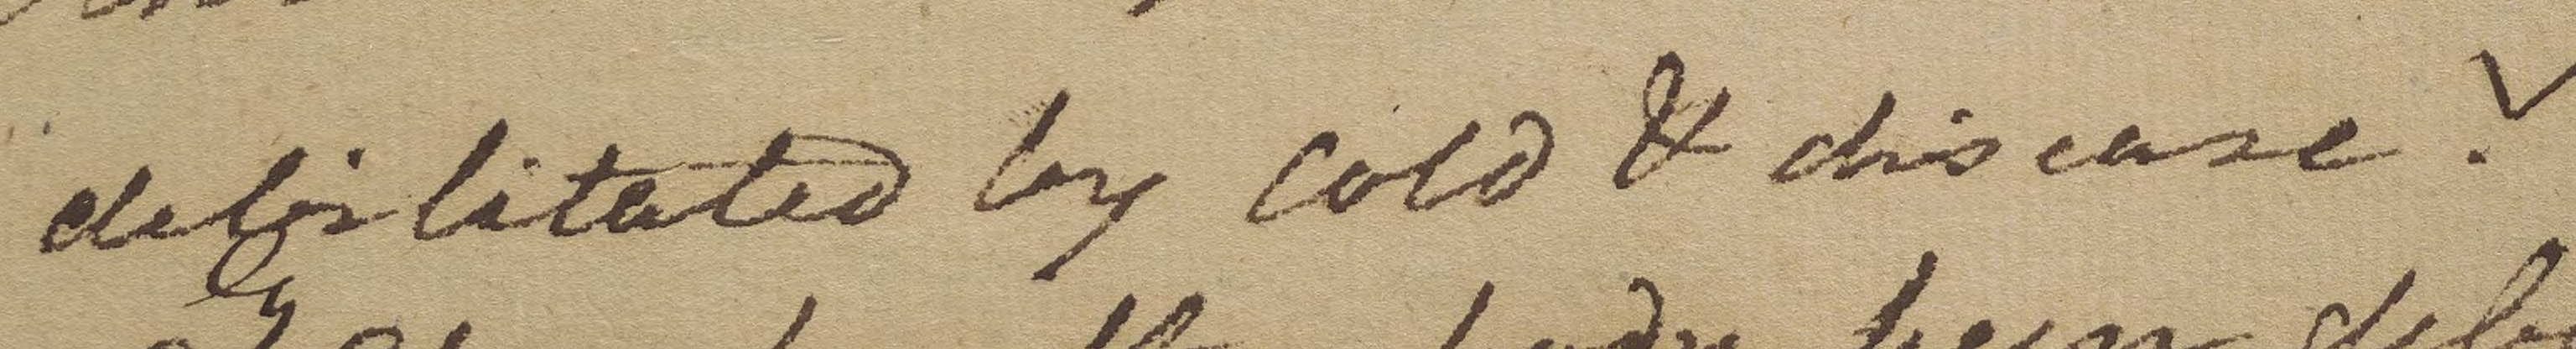debilitated by cold & disease.
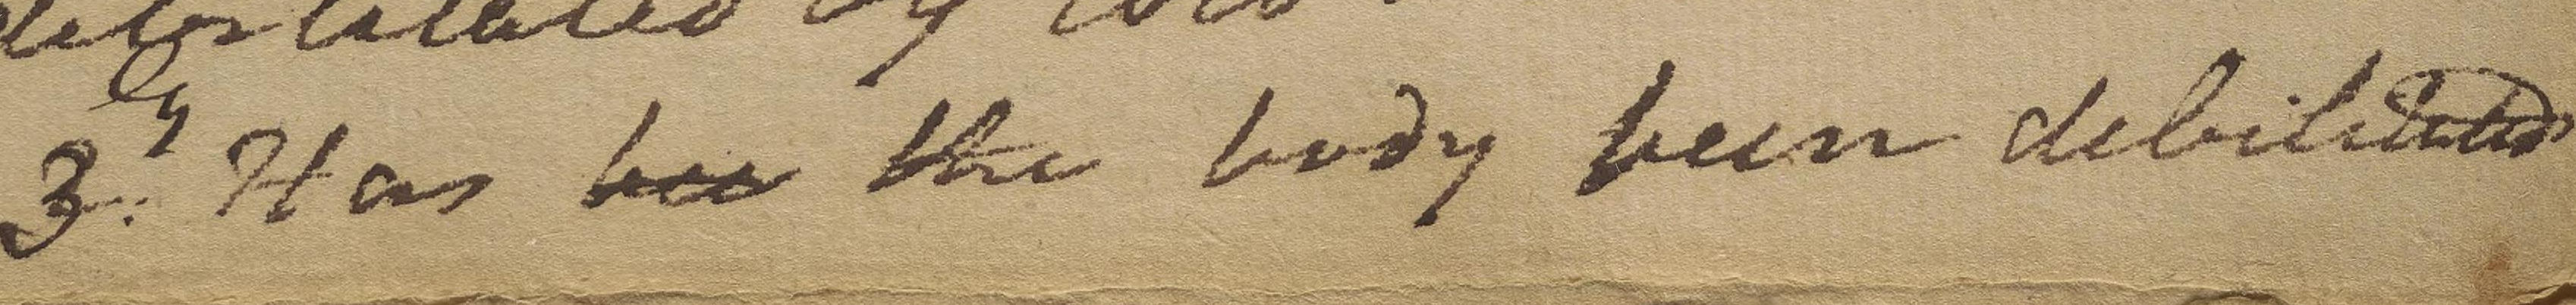3^d Has [bee] the body been debilitated
